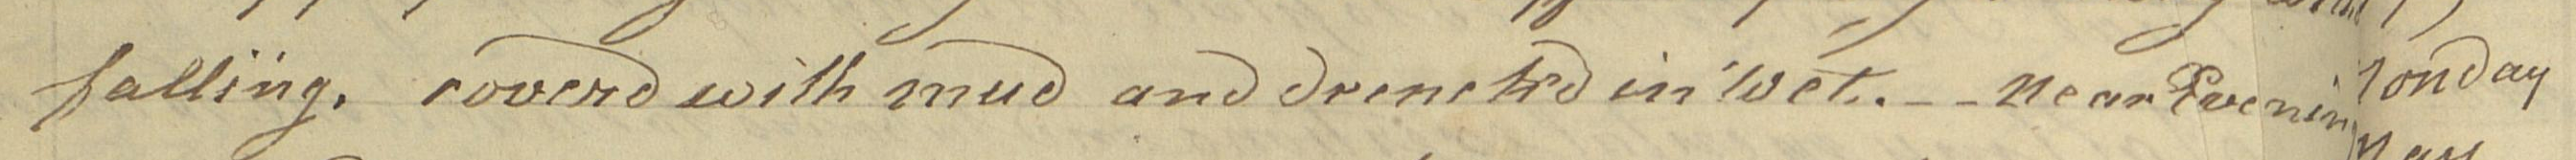falling, coverd with mud and drench'd in wet. Near evening
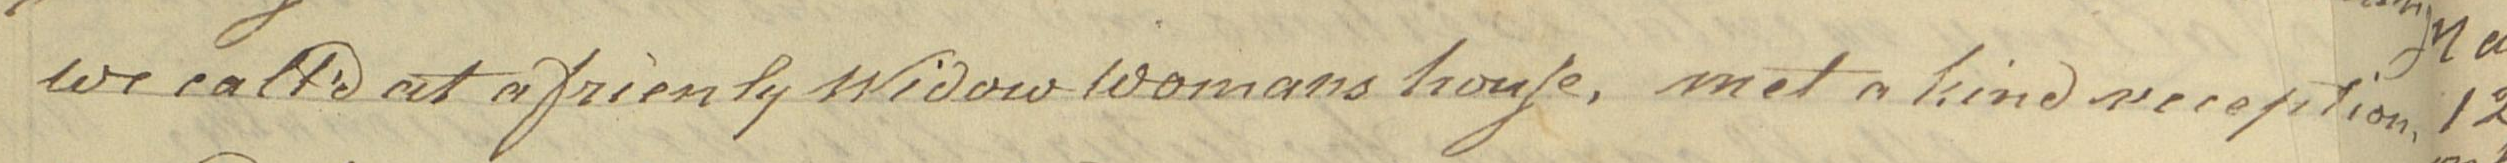we call'd at a frienly Widow Womans house, met kind reception,
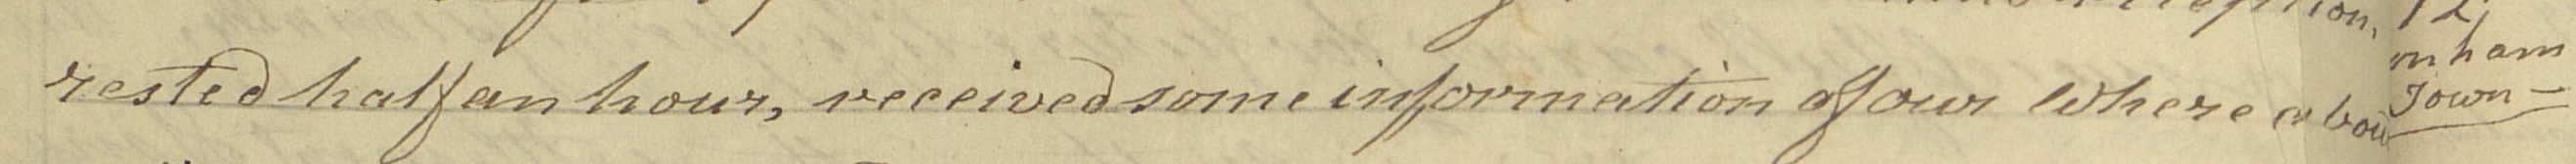rested half an hour, received some information of our whereabou
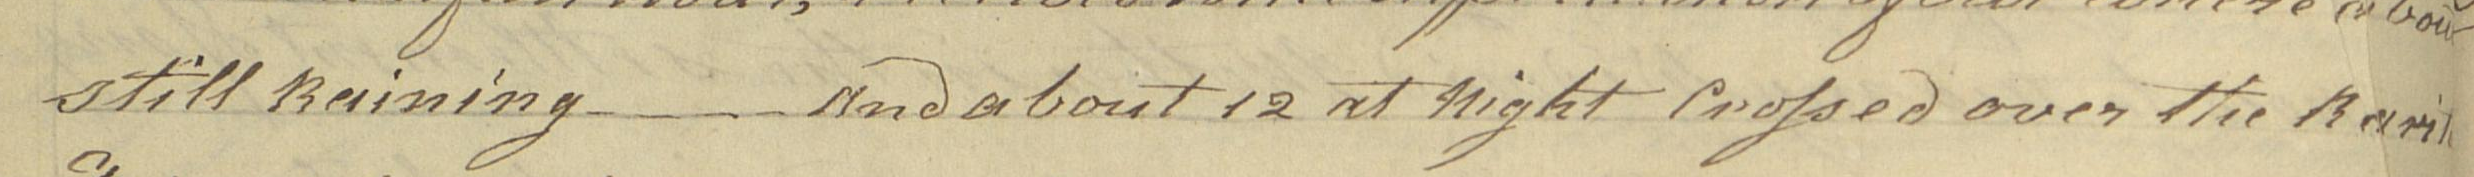still raining And about 12 at night Crossd over the Ram-
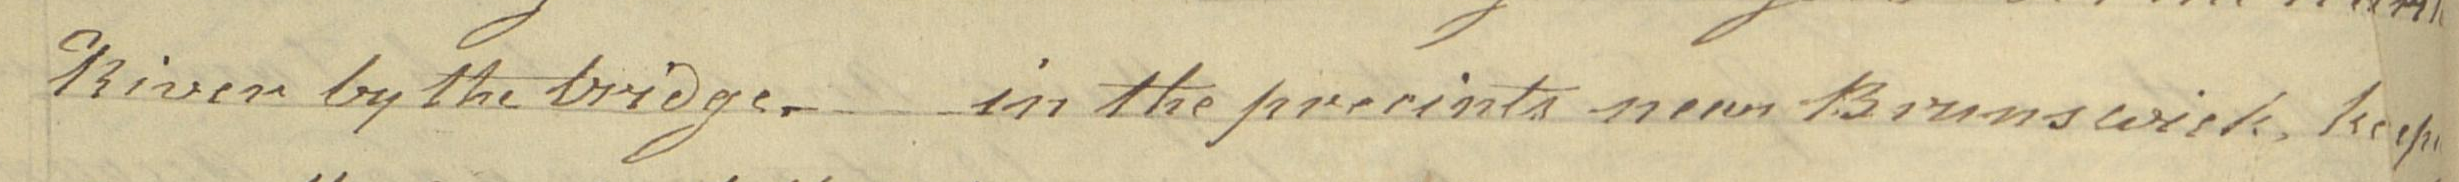River by the bridge. in the precincts new Brunswick, keep-
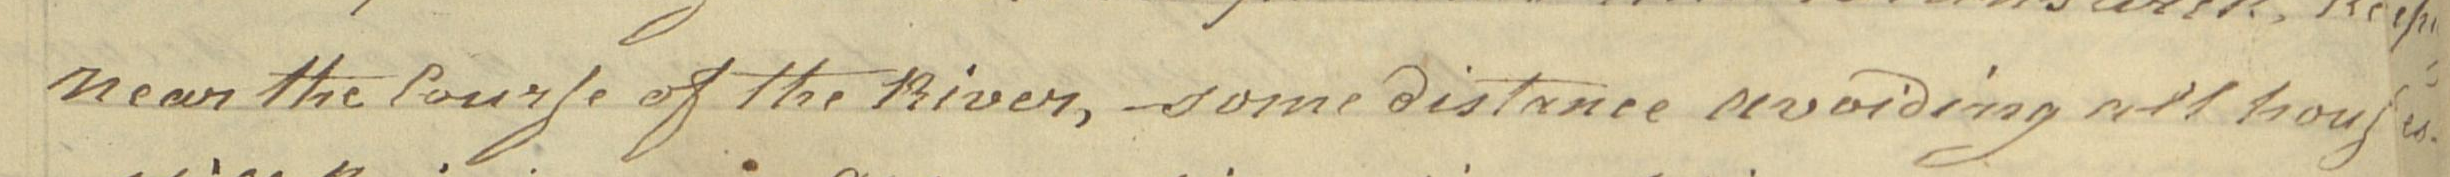near the course of the River, some distance avoiding all house
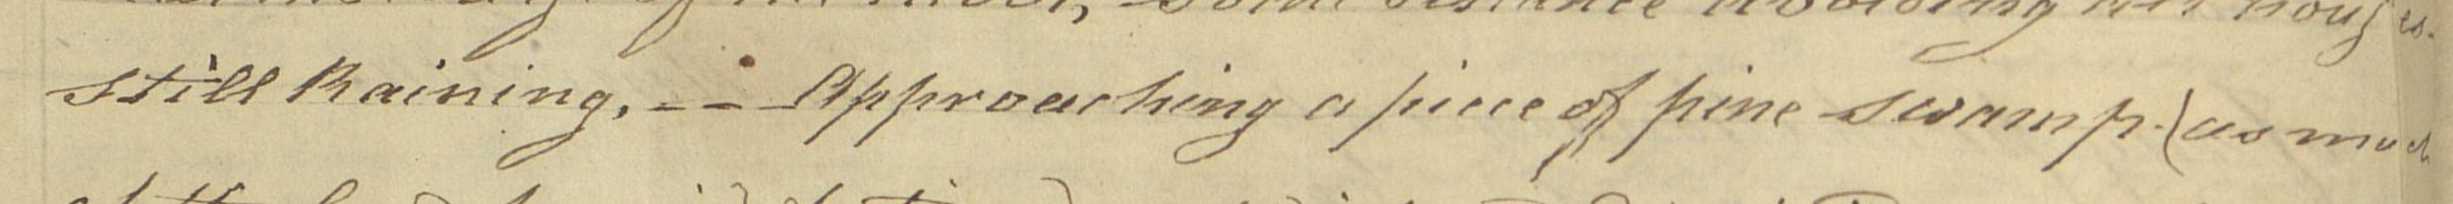still Raining, Approaching a piece of pine swamp (as much
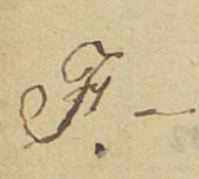F.
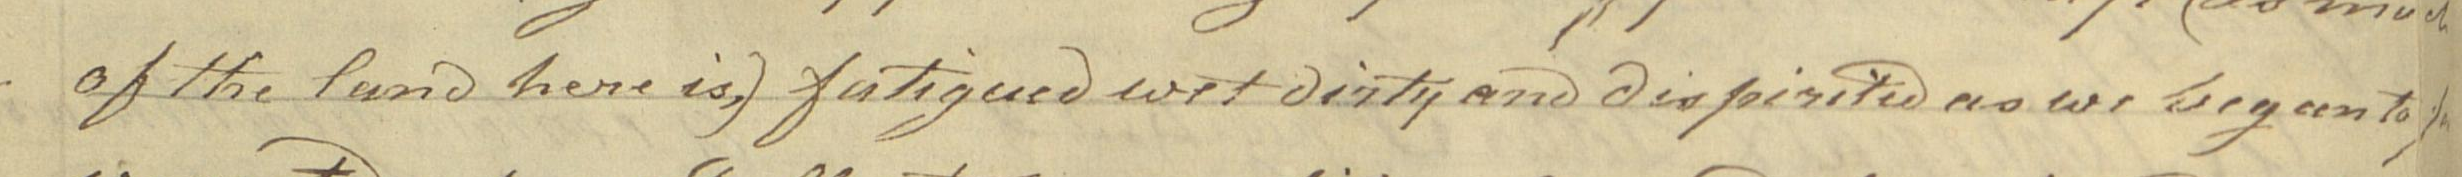of the land here is,) fatigued wet dirty and dispirited as we began to)
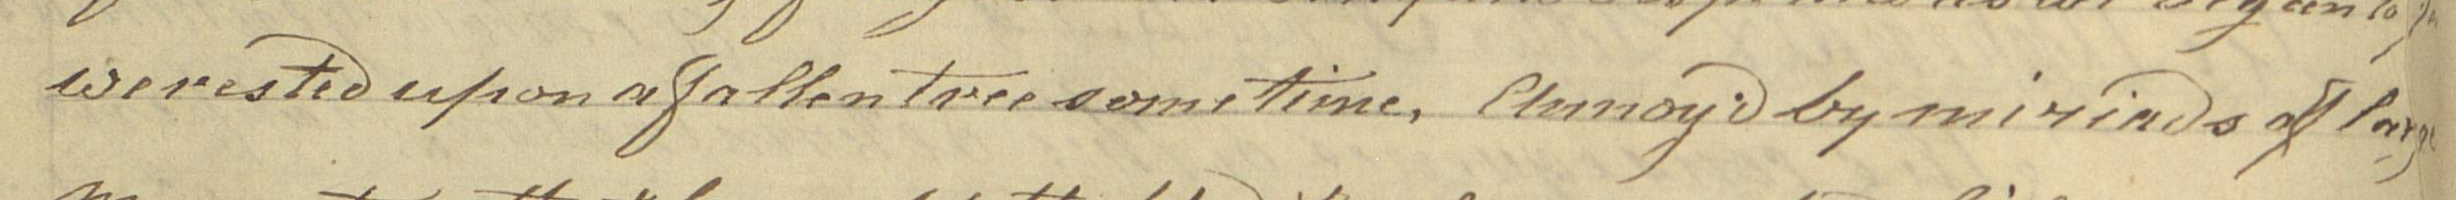we rested upon a fallen tree some time, annoy'd by miriads of larg-
